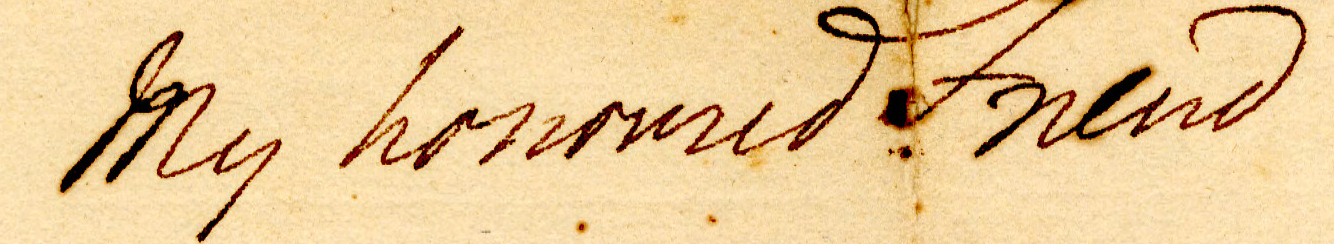My honoured Friend
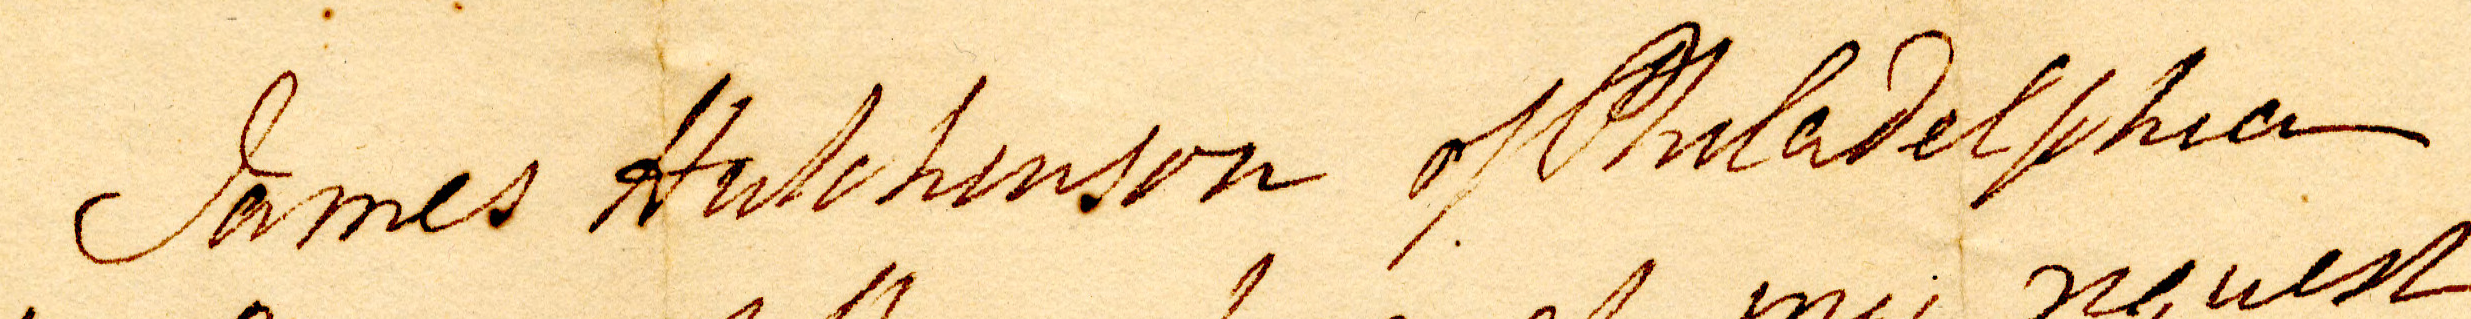James Hutchinson of Philadelphia
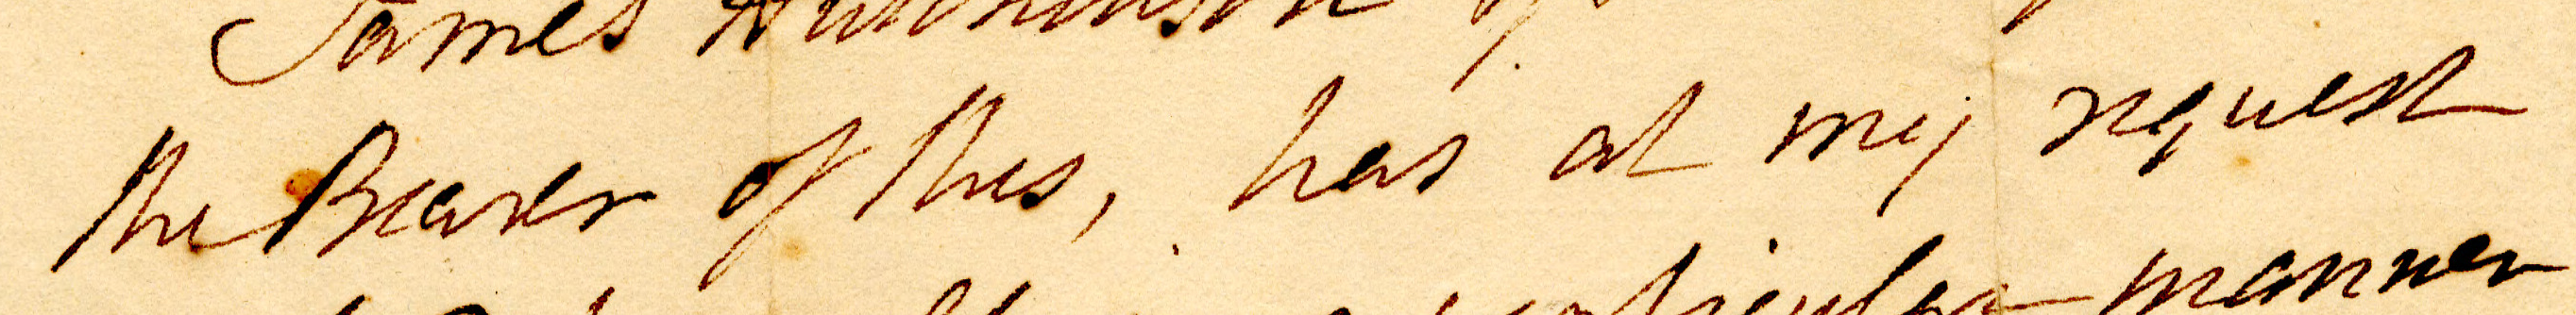the Bearer of this, has at my request
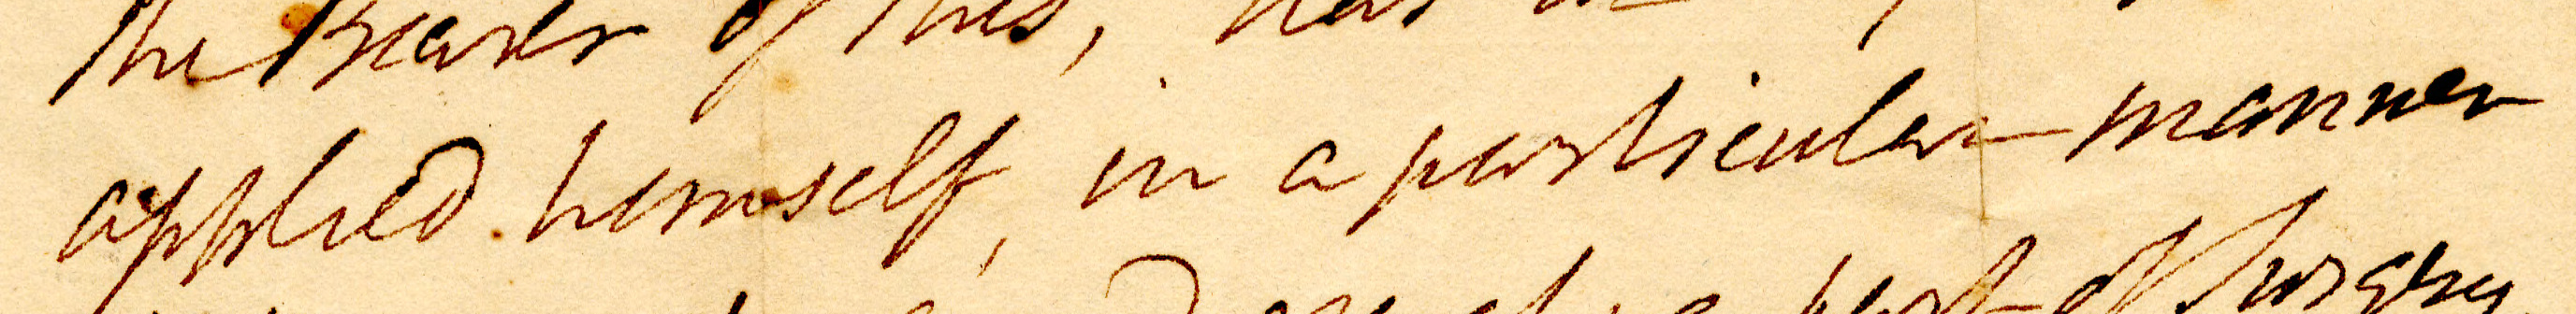applied himself in a particular manner
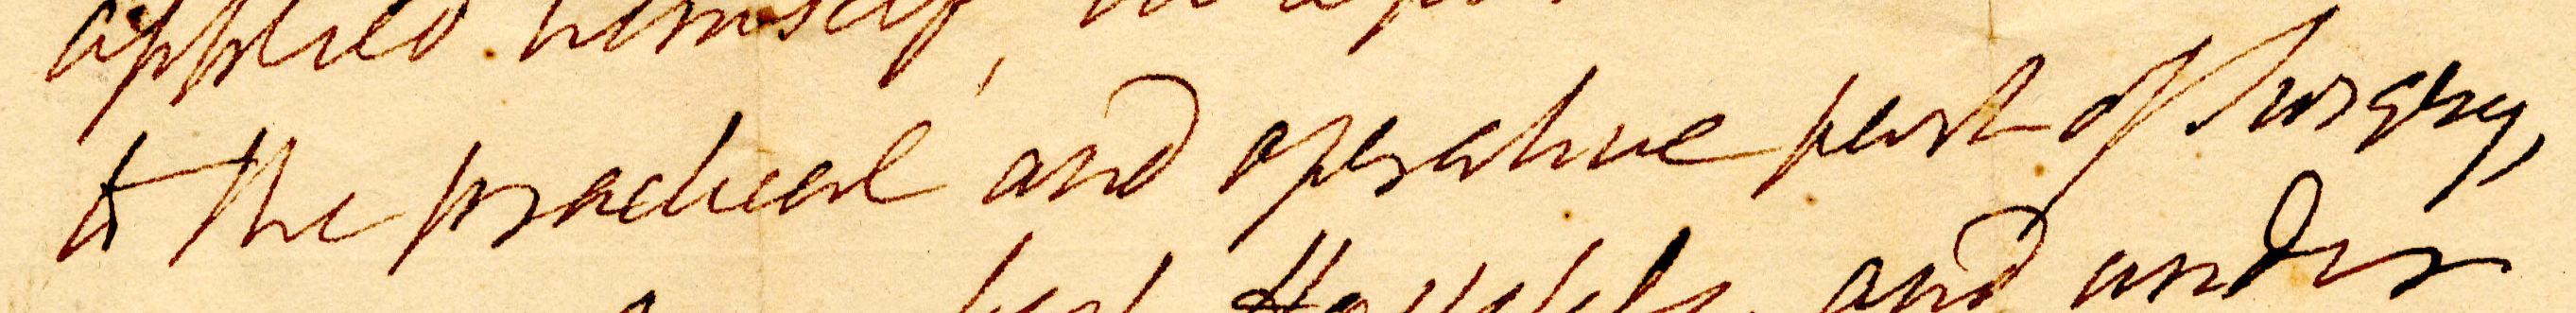to the practical and operative part of surgery,
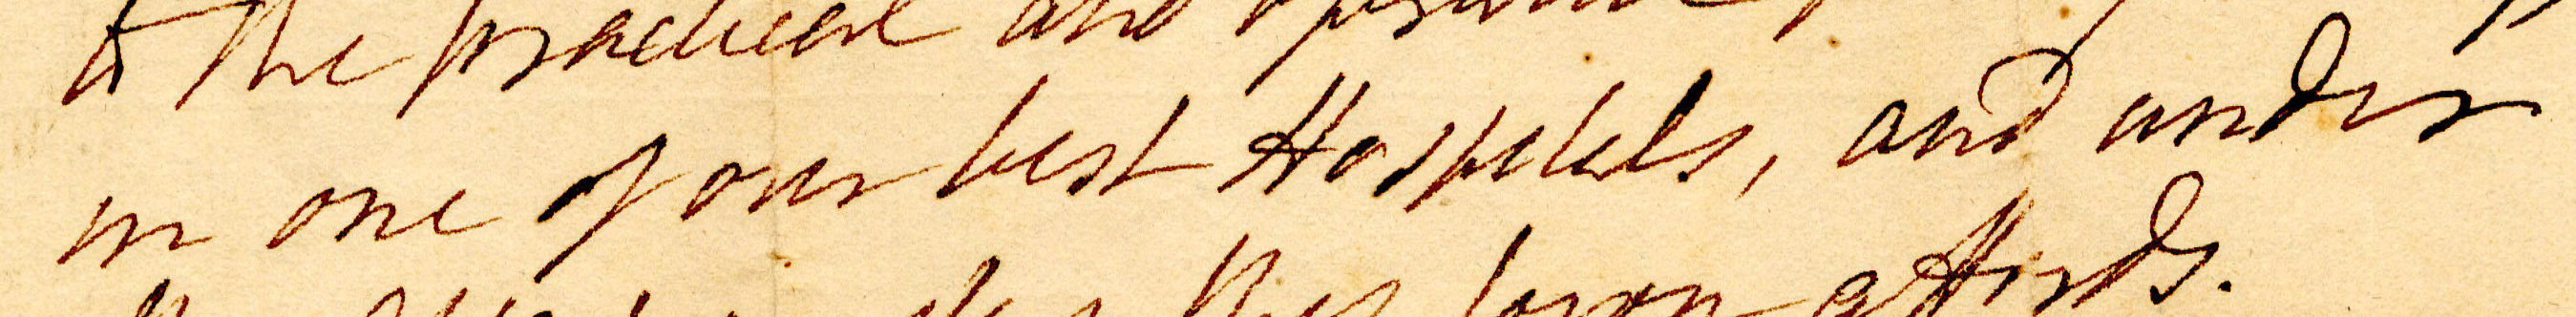in one of our best Hospitals, and under
